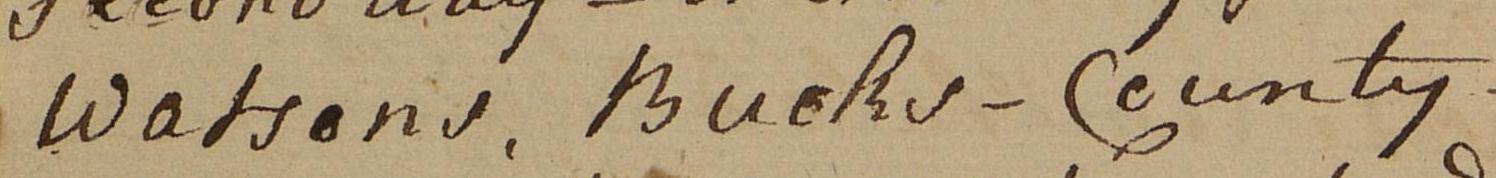Watsons, Bucks-County
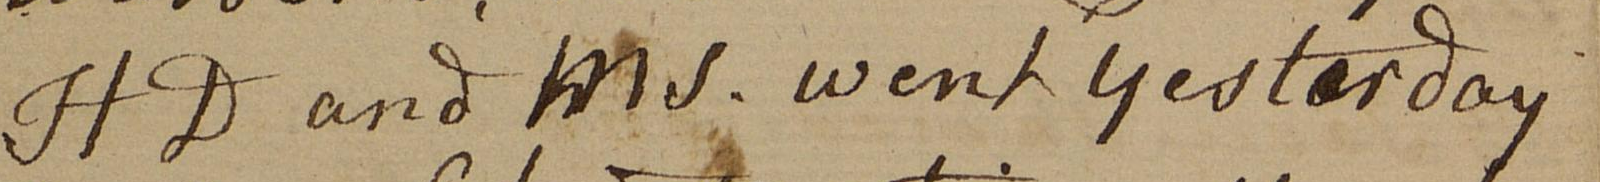HD and MS went yesterday
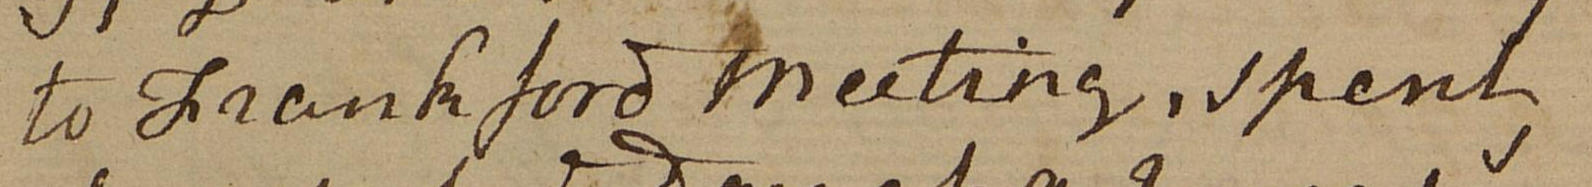to Frankford meeting, spent
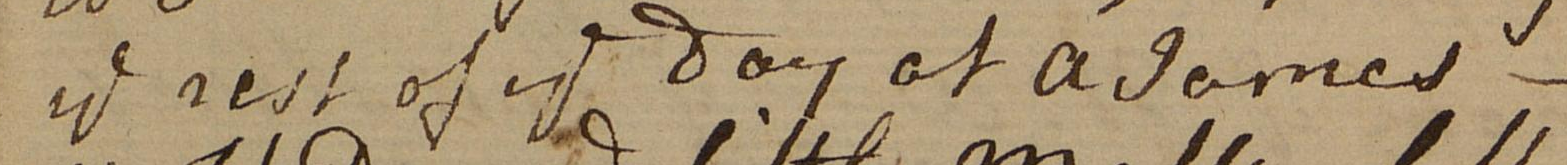y^e rest of y^e day at A James^s-
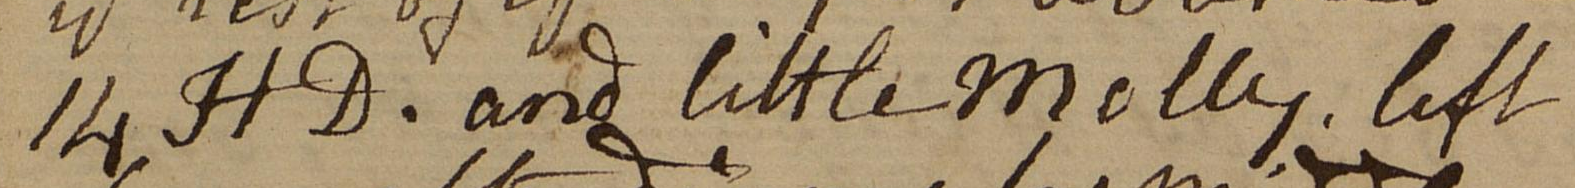14 HD. and little Molly left
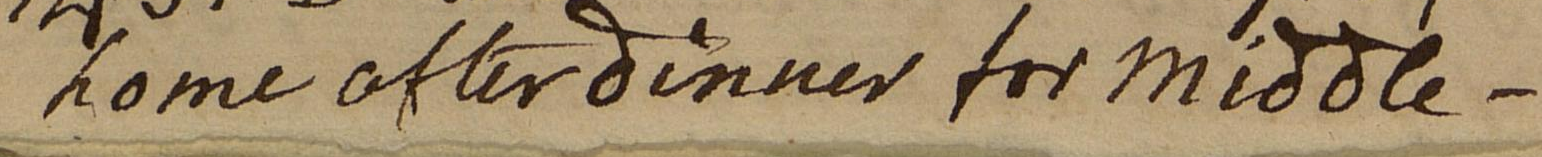home after dinner for middle-
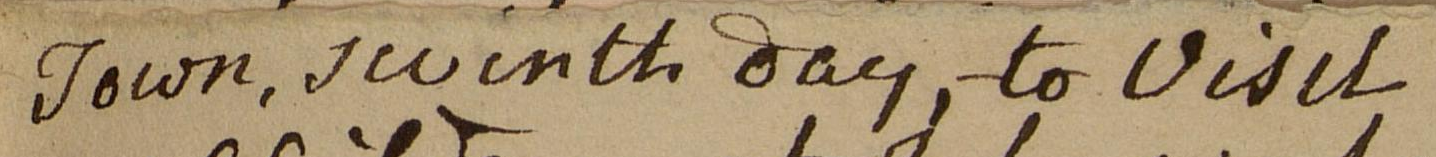Town, seventh day, to visit
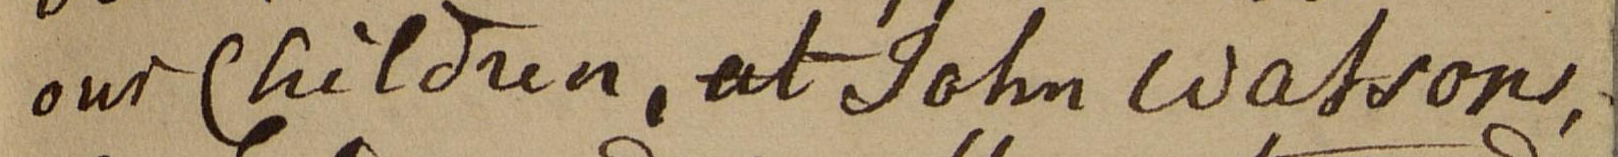our Children, at John Watsons
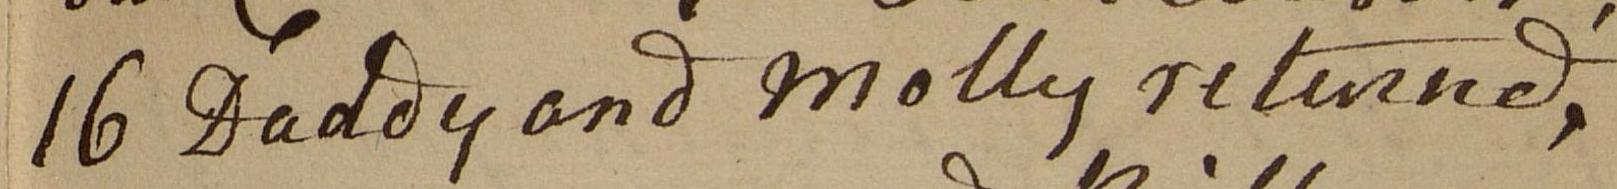16 Daddy and Molly returnd,
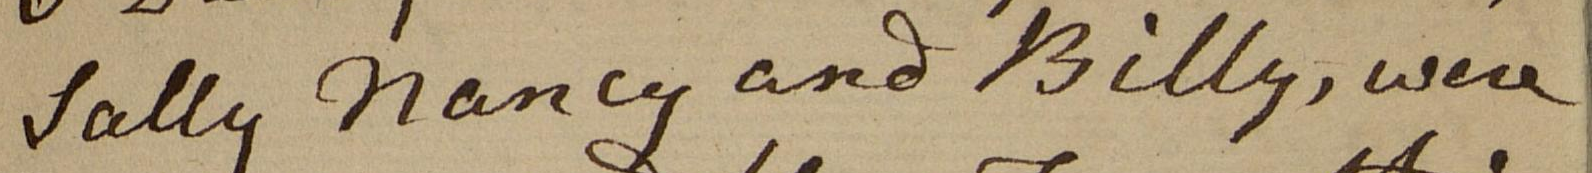Sally Nancy and Billy, were
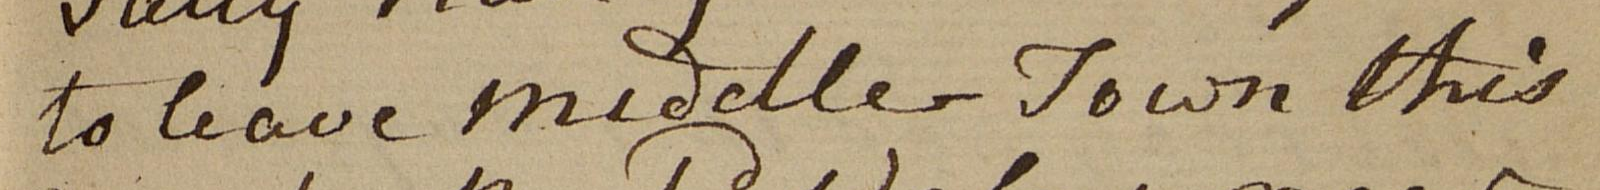to leave middle Town this
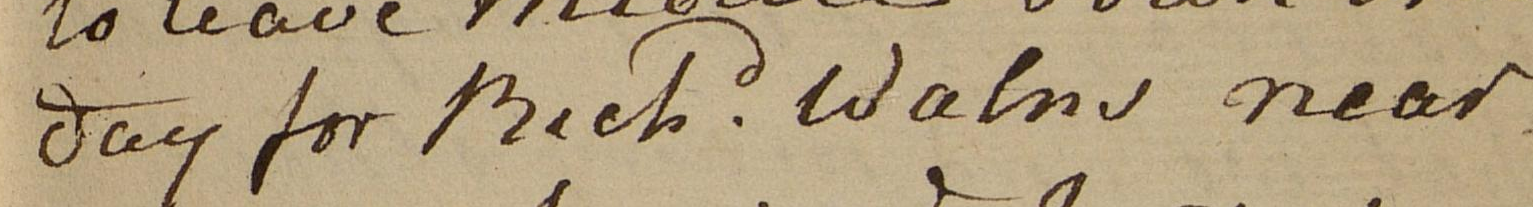day for Rich^d. Walns near
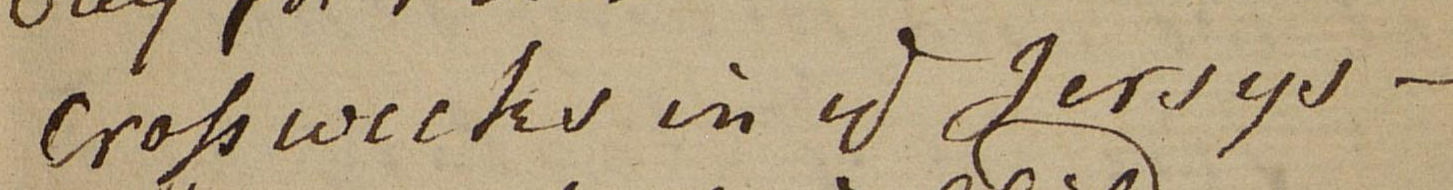Cross weeks in y^e Jersys-
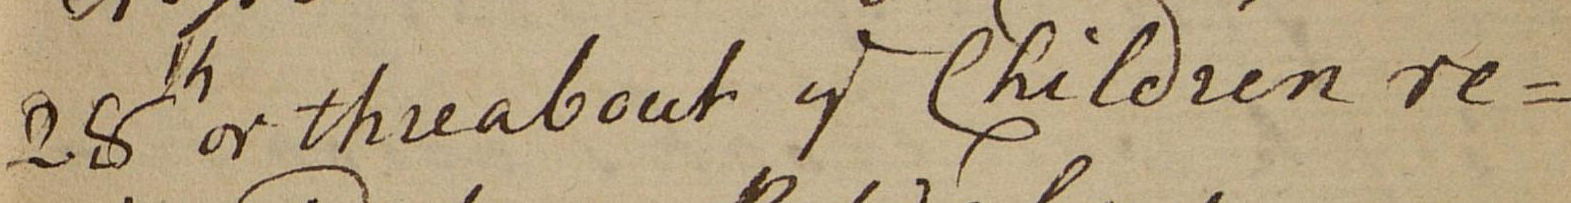28^th or threabout y^e Children re-
